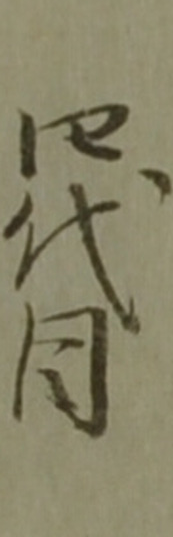四代目
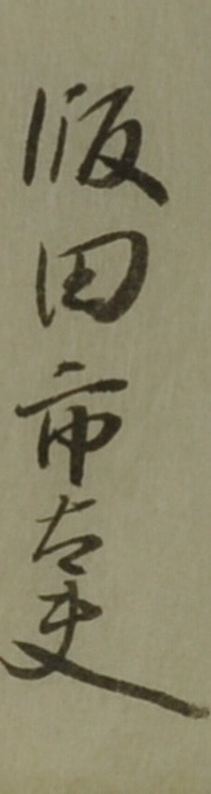飯田市太夫
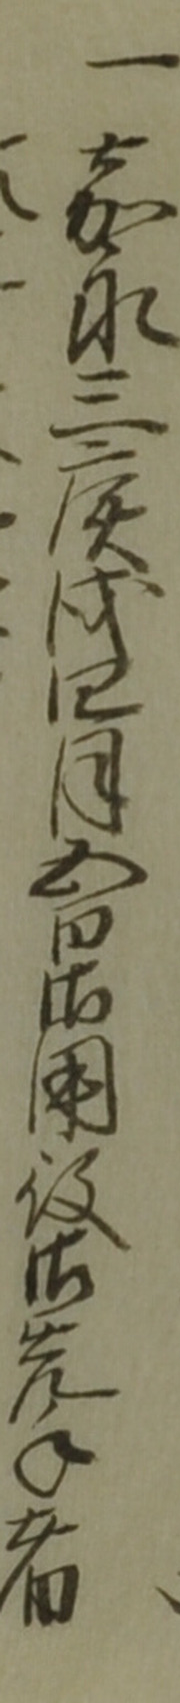一嘉永三庚戌四月五日御用役御先手者
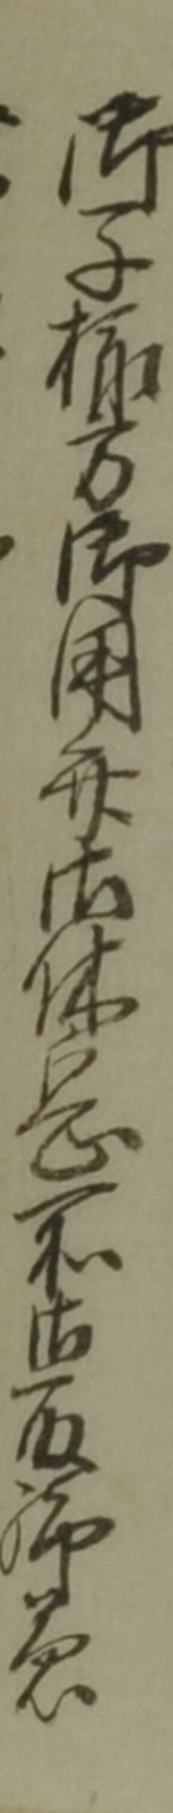御子様方御用并御休息所御取締兼
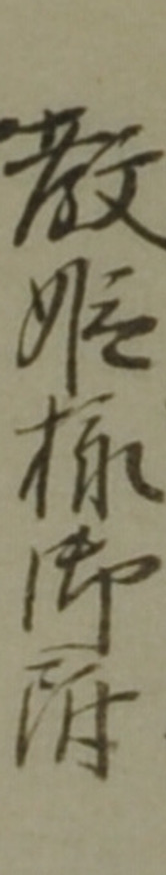教姫様御附
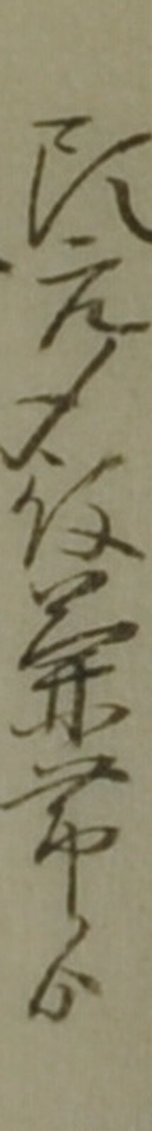頭元〆役兼帯ゟ
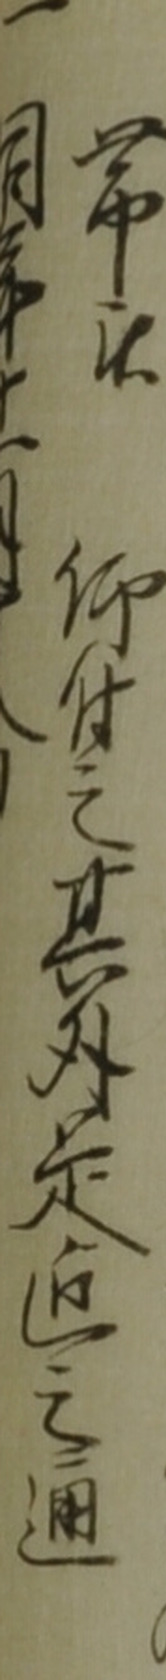帯被仰付之其外是迄之通
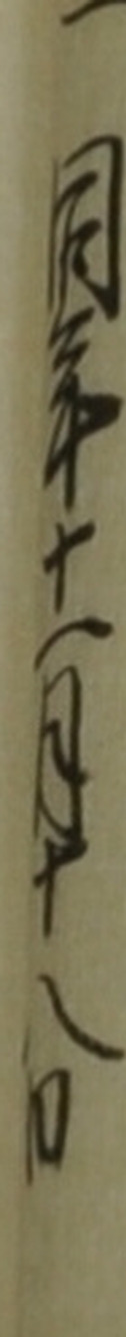一同年十一月十八日
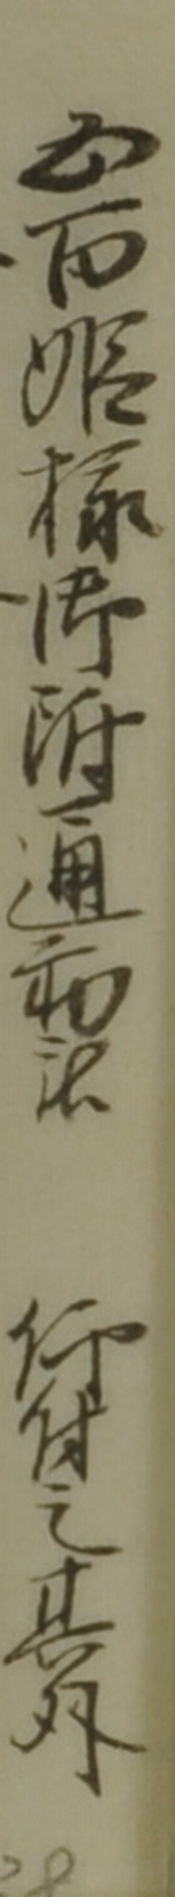五百姫様御附通初被仰付之其外
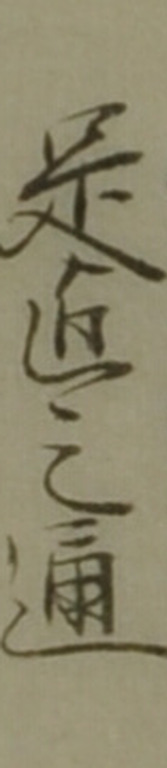是迄之通

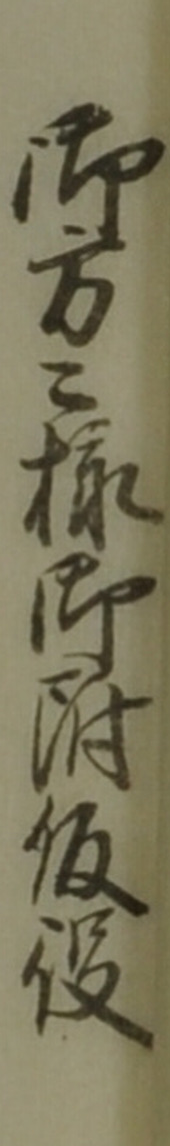御方々様御附仮役
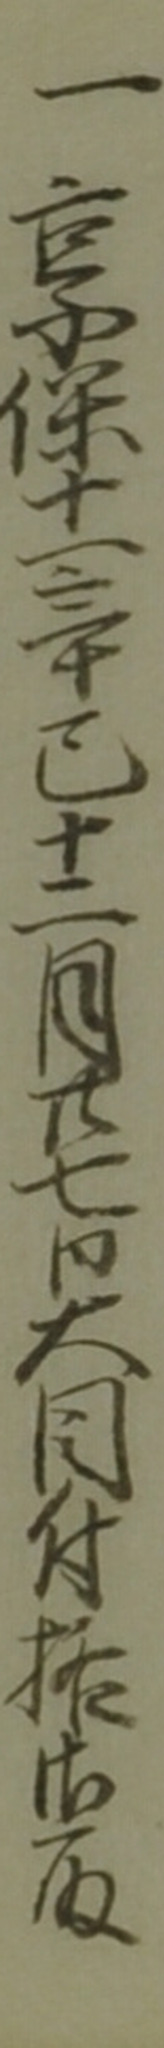一享保十一辛巳十二月廿七日大目付格御取
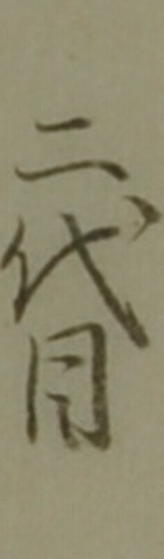二代目
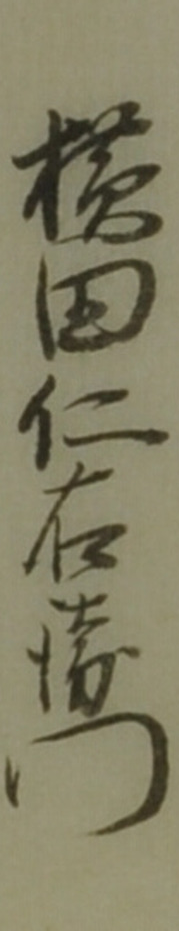横田仁右衛門
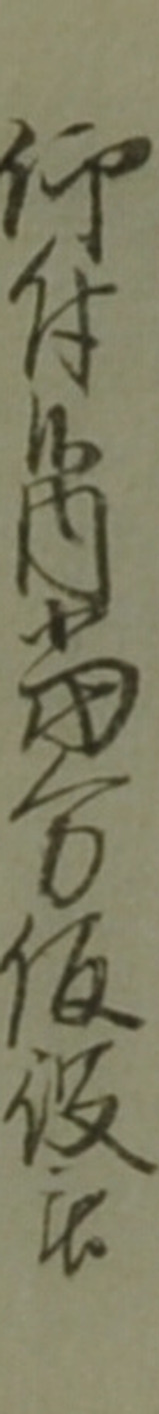仰付候内当分仮役被
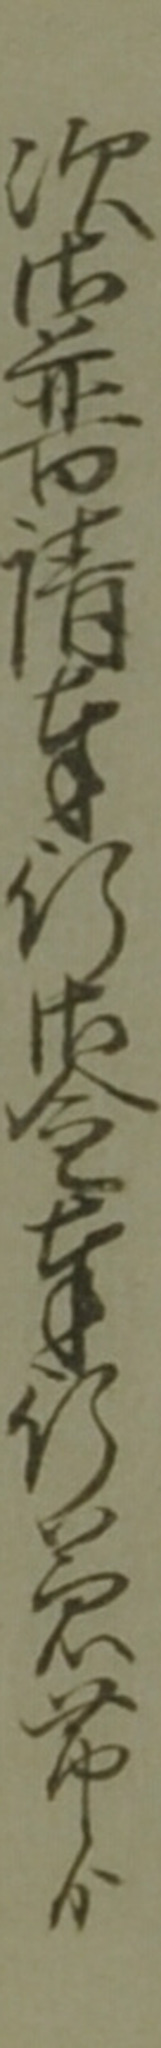次御普請奉行御金奉行兼帯ゟ
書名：諸御役代々録（六）
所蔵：伊那市立高遠町図書館・合同会社AMANE
